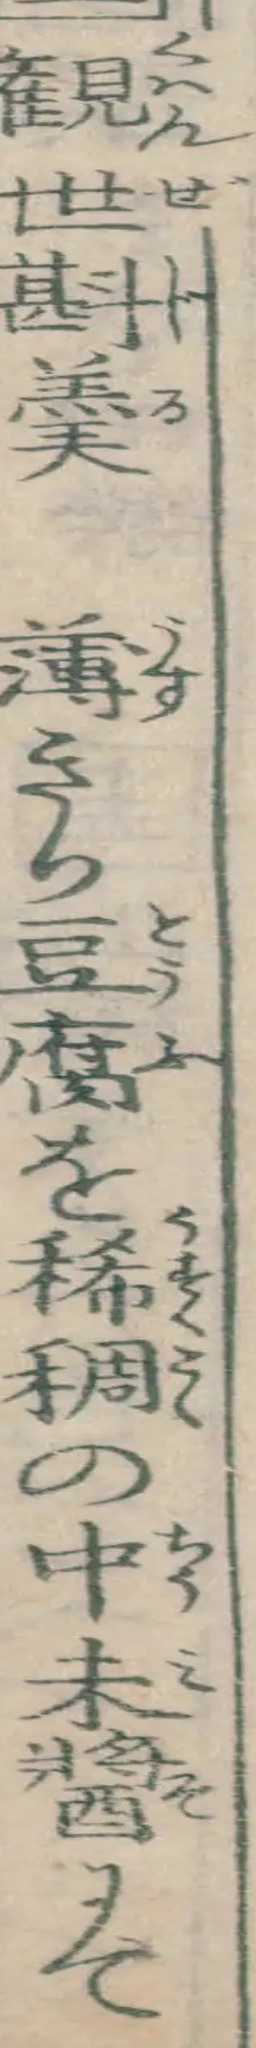十三観世斟羹薄きり豆腐を稀稠の中未醤にて
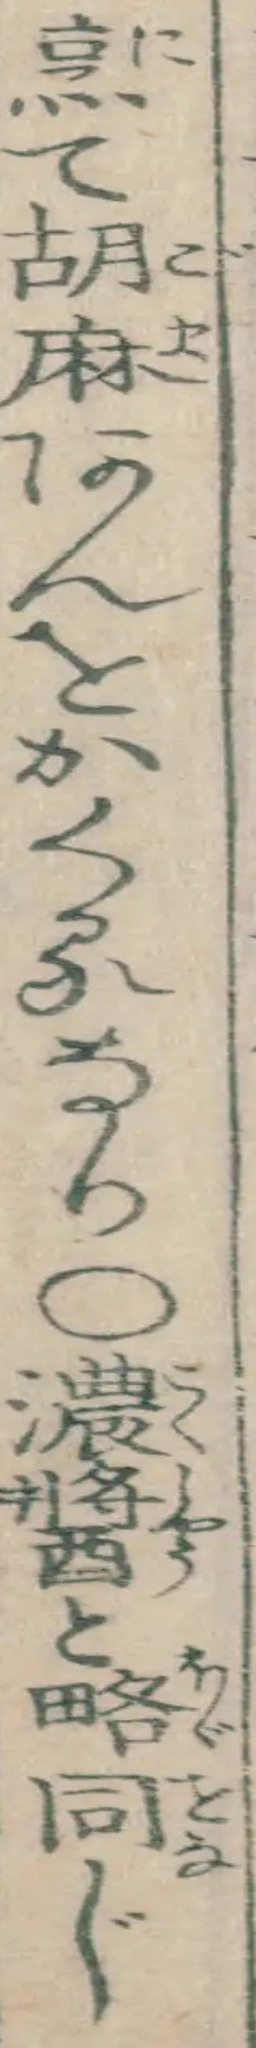烹て胡麻あんをかくるなり○濃醤と略同じ

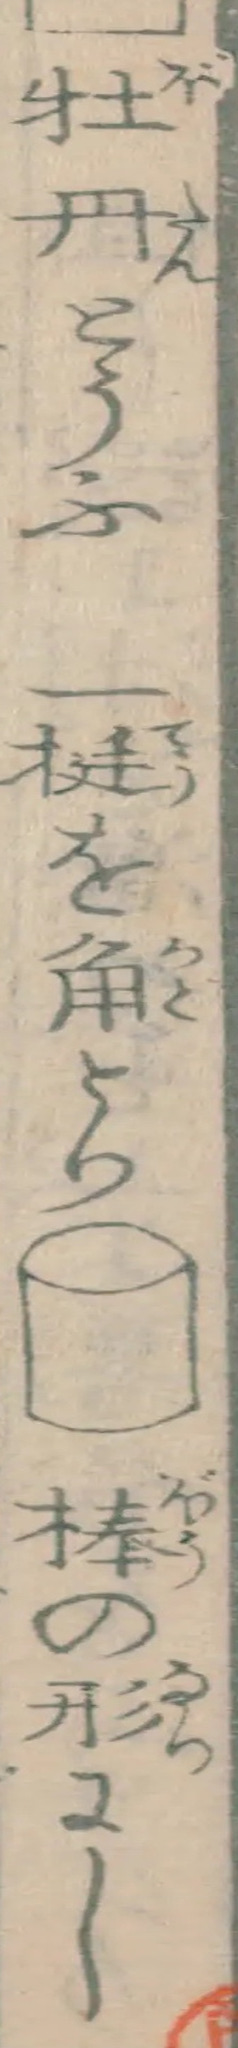廿一牡丹とうふ一挺を角とり棒の形にし
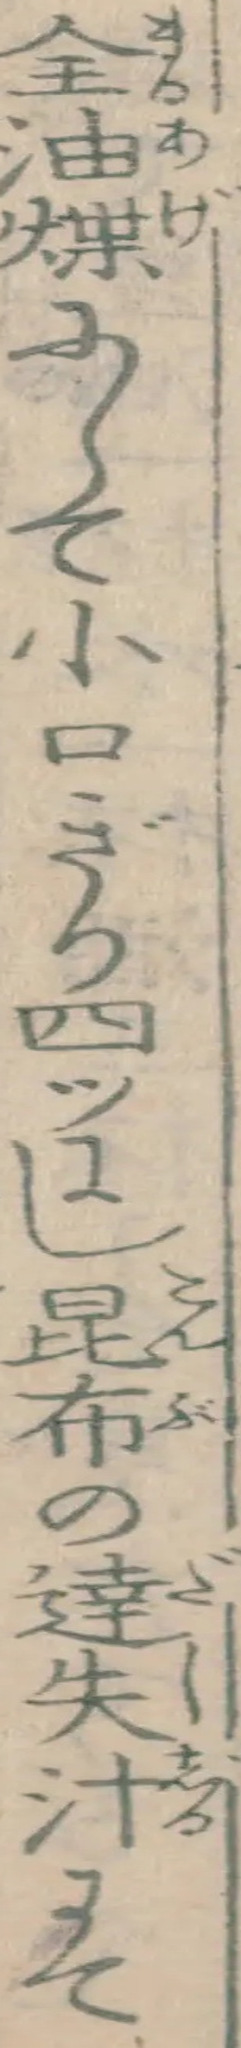全油煠にして小口ぎり四つにし昆布の達失汁にて
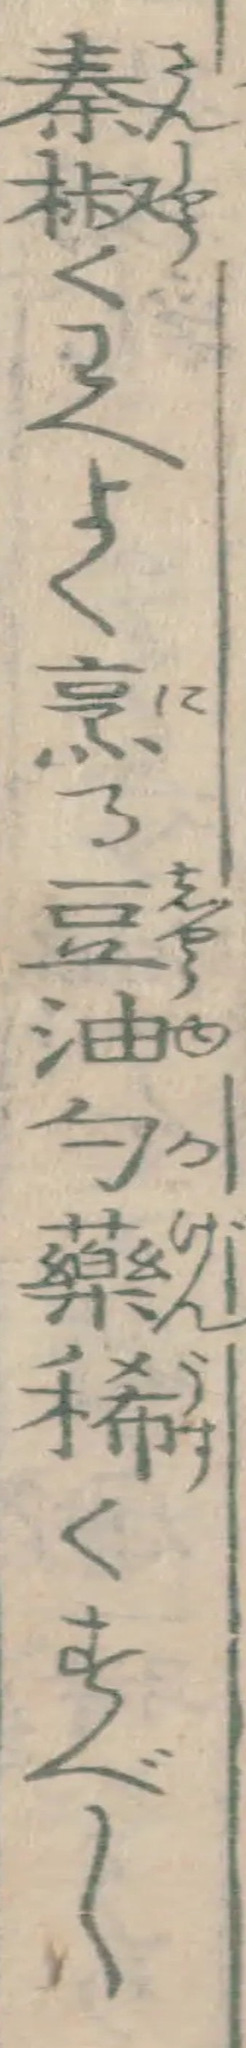秦椒くわへよく烹る豆油勺薬稀くすべし
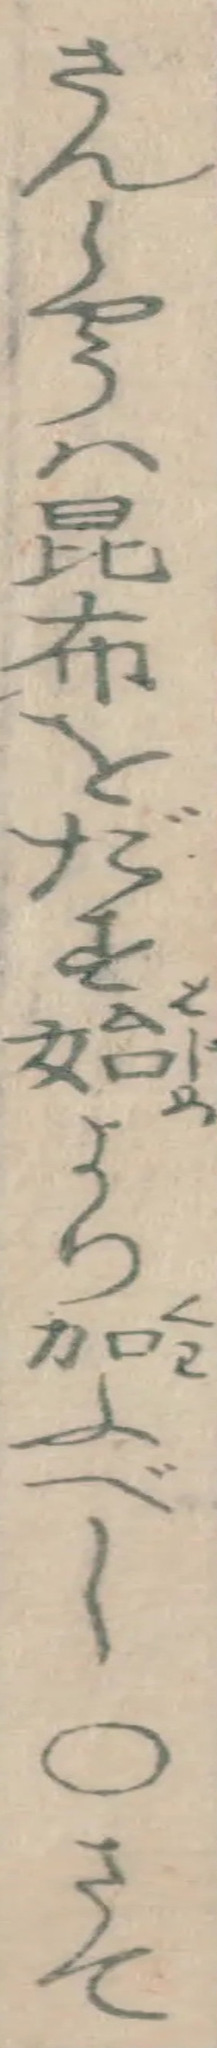さんしやうは昆布をだす始より加ふべし○さて
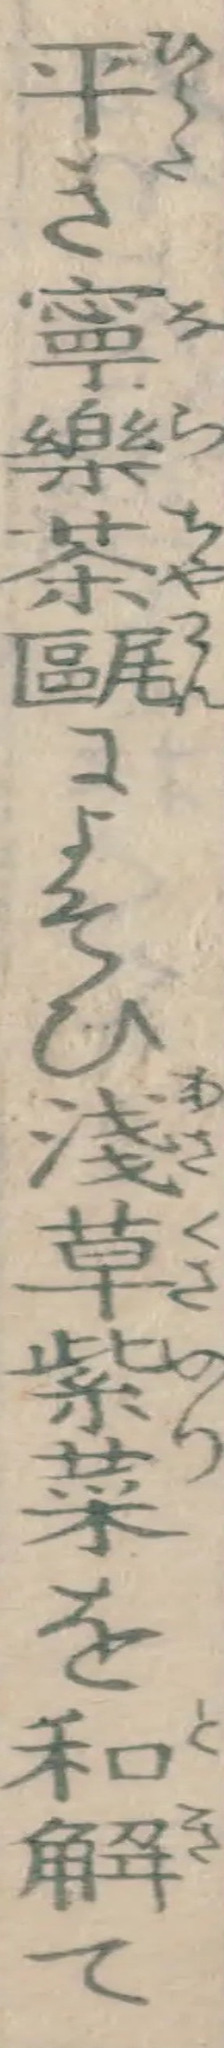平き寧楽茶甌によそひ浅草紫菜を和解て
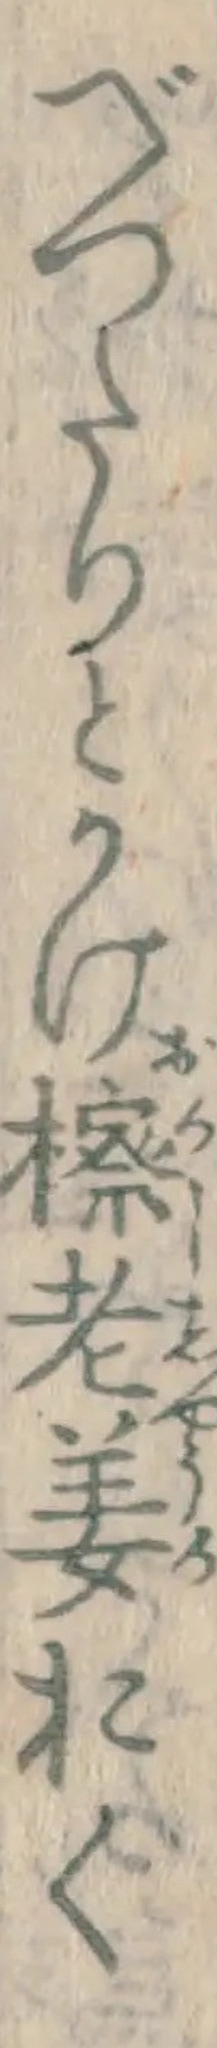べつたりとかけ擦老姜おく
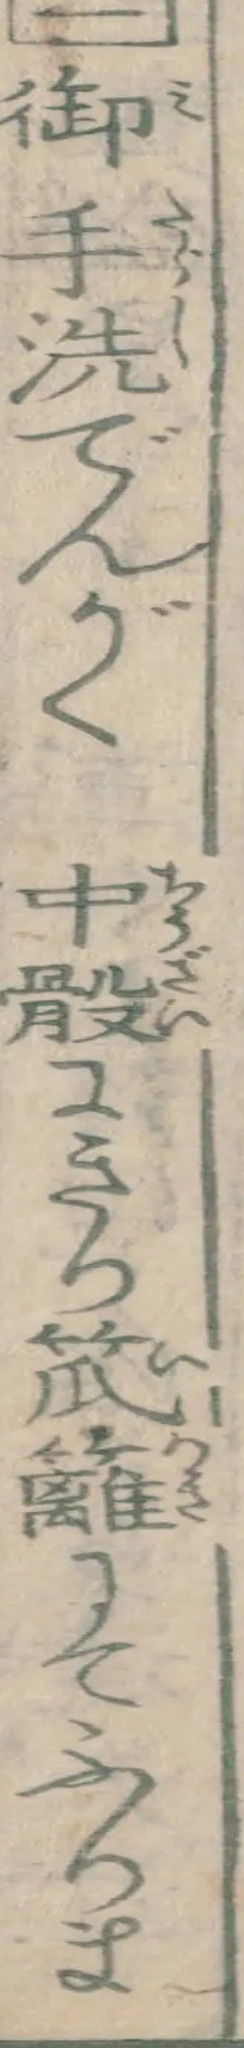廿二御手洗でんがく中骰にきり笊籬にてふりま
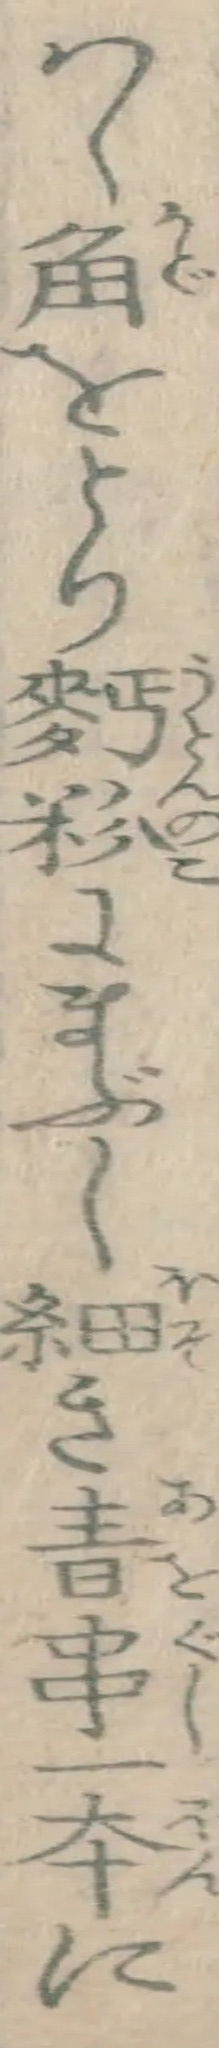はし角をとり麪粉にまぶし細き青串一本に
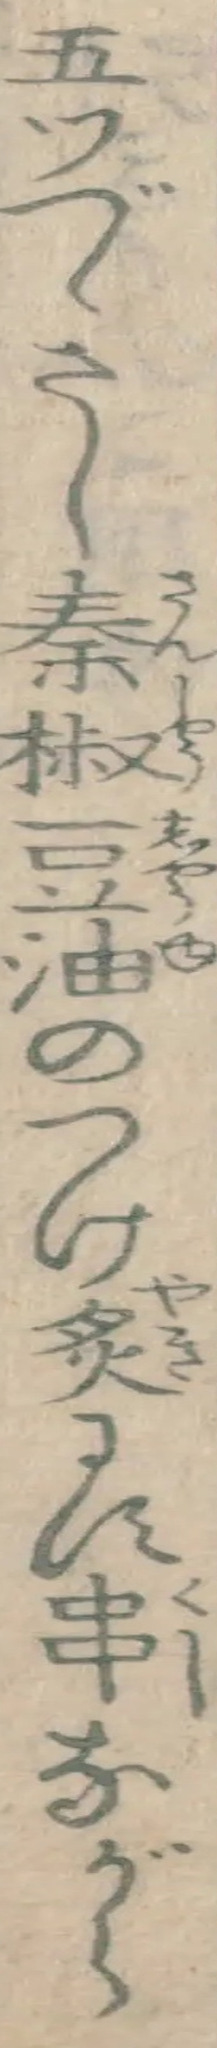五つづゝさし秦椒豆油のつけ炙にす串ながら

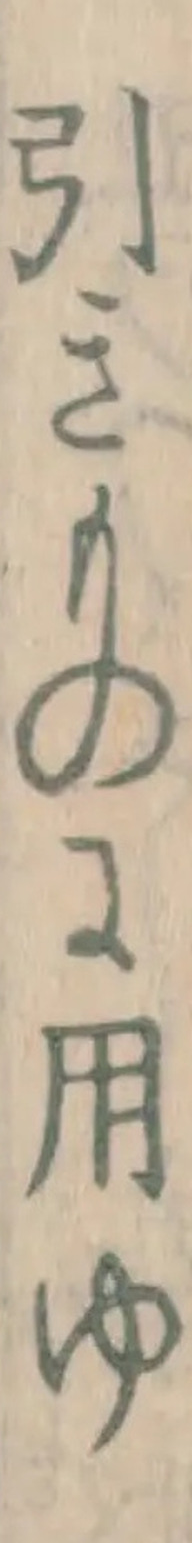引きものに用ゆ
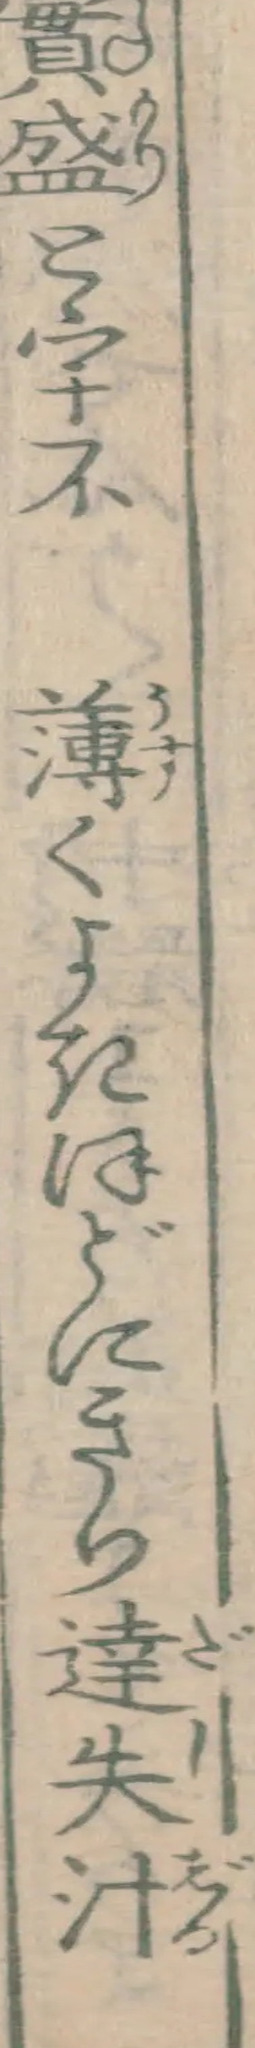廿三実盛と宇不薄くよきほどにきり達失汁
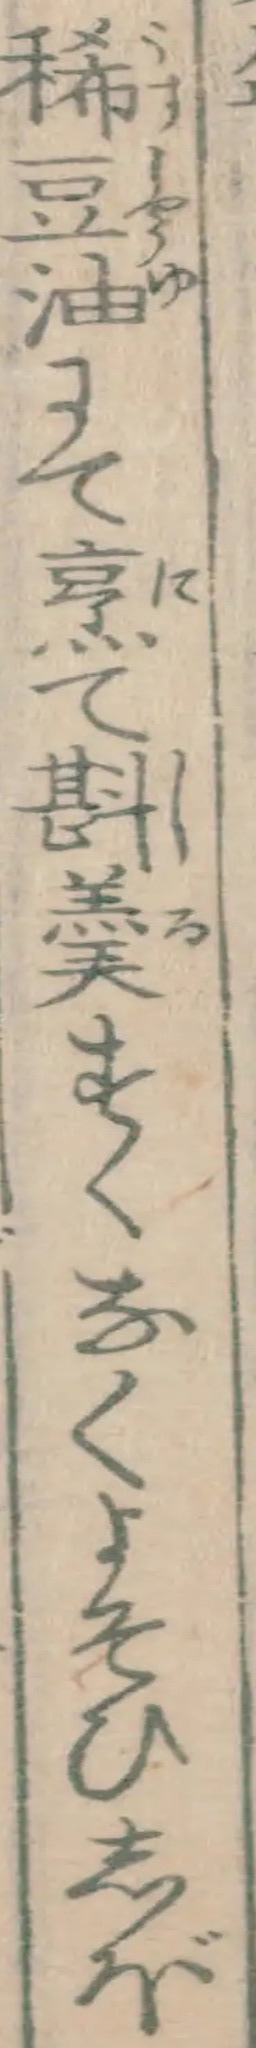稀豆油にて烹て斟羹すくなくよそひしぼ
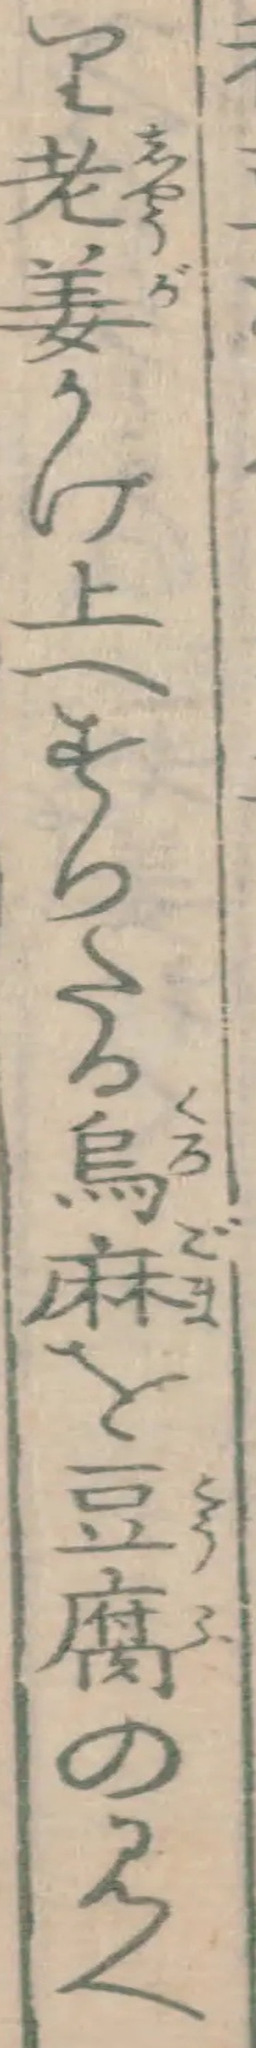り老姜かけ上へすりたる烏麻を豆腐の見へ
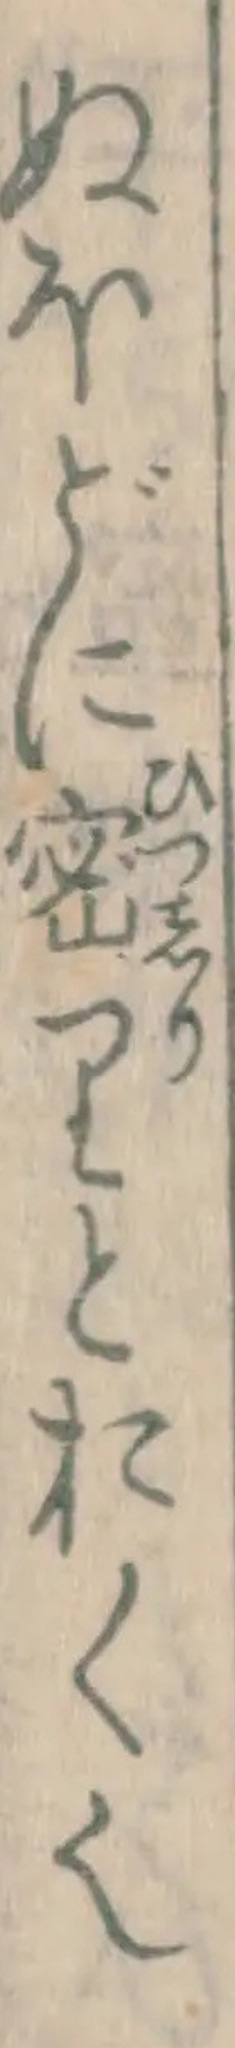ぬほどに密りとおく也
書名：豆腐百珍. 続編
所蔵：国立国会図書館 National Diet Library, JAPAN
